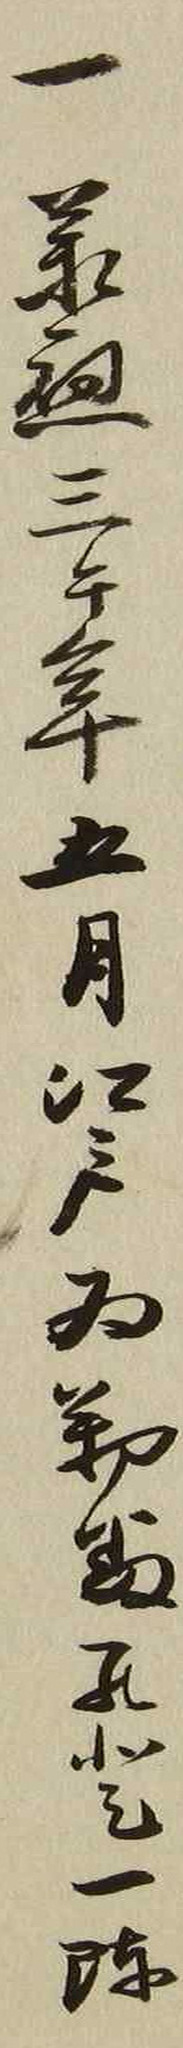一承応三午年五月江戸為勤番罷登一陣
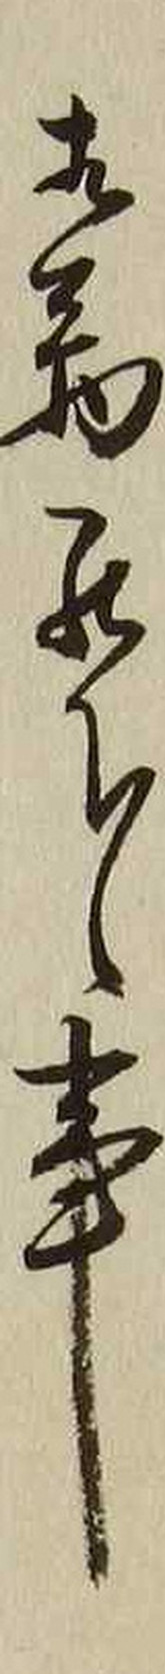相勤罷下候事
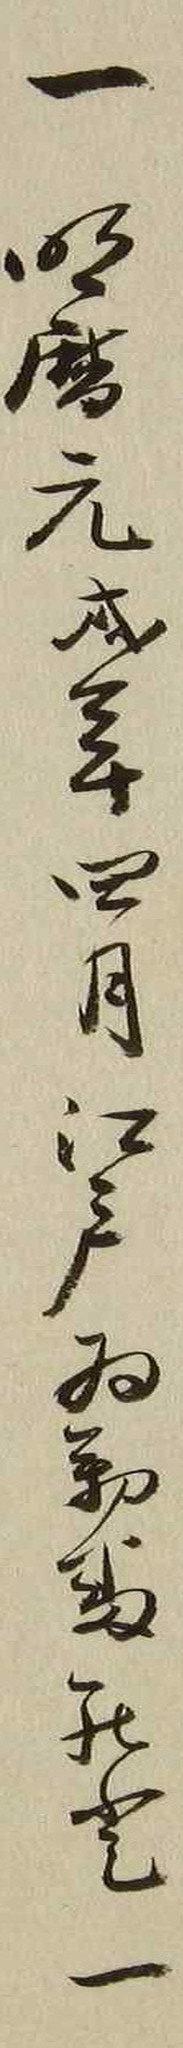一明暦元戌年四月江戸為勤番罷登一
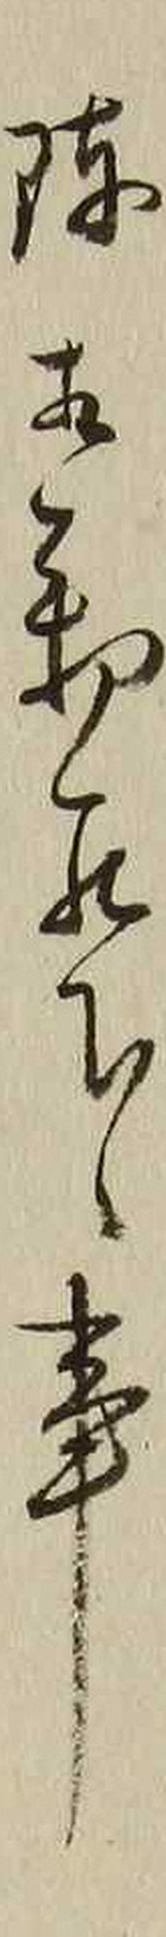陣相勤罷下候事
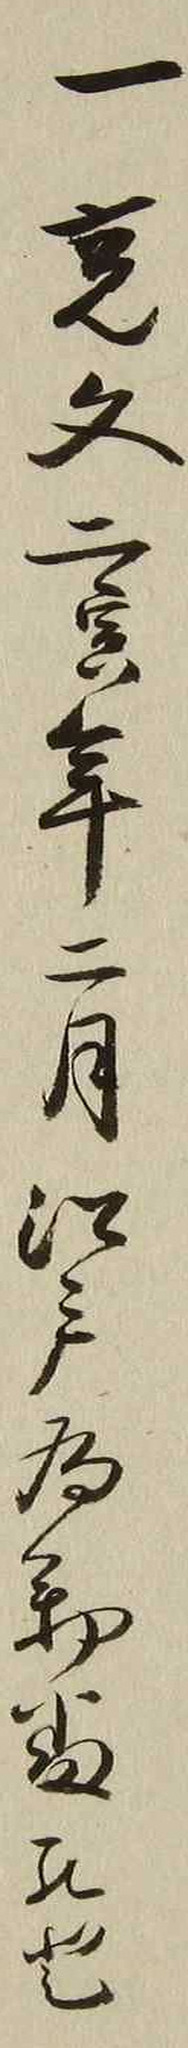一寛文二寅年二月江戸為勤番罷登
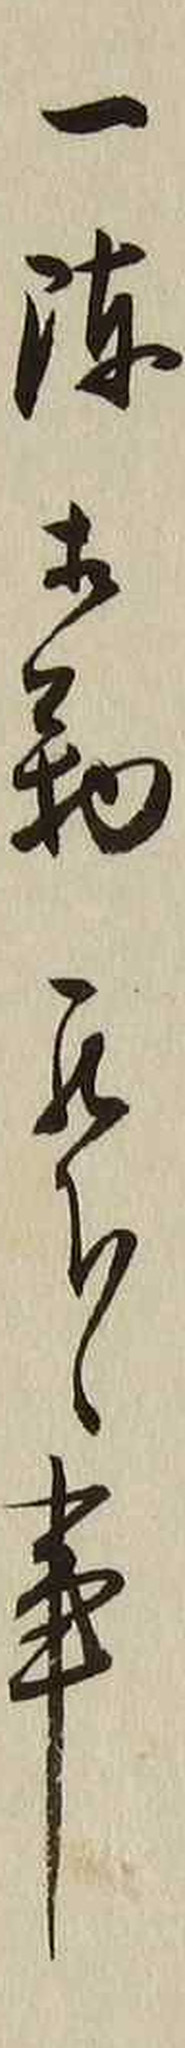一陣相勤罷下候事
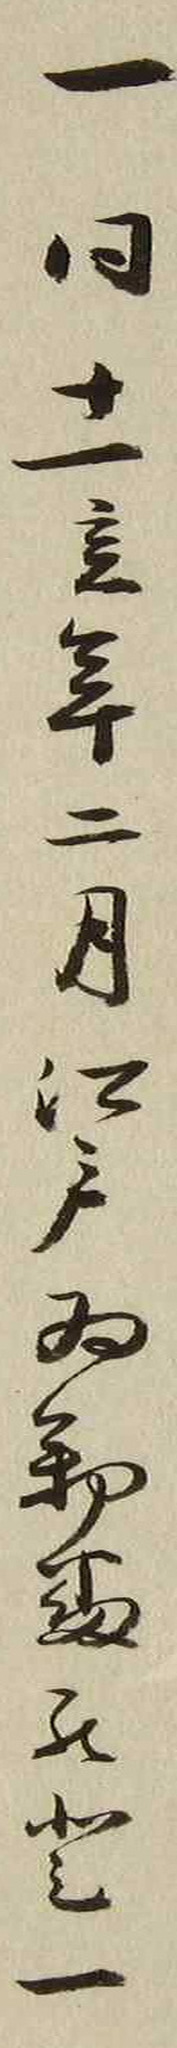一同十一亥年二月江戸為勤番罷登一
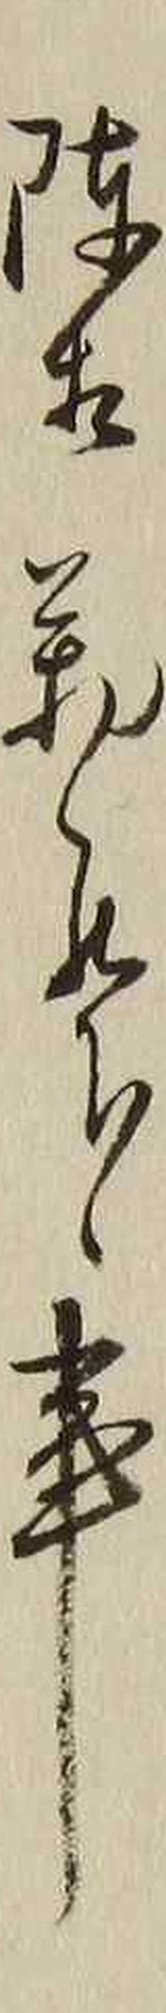陣相勤罷下候事
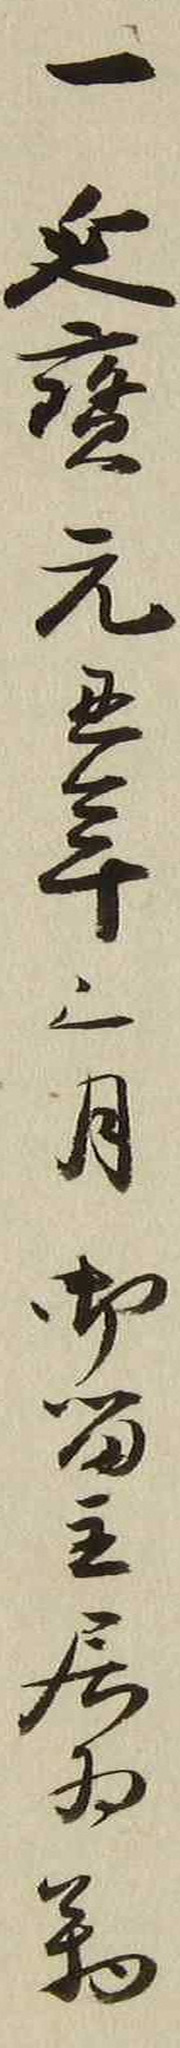一延宝元丑年三月御留主居為勤
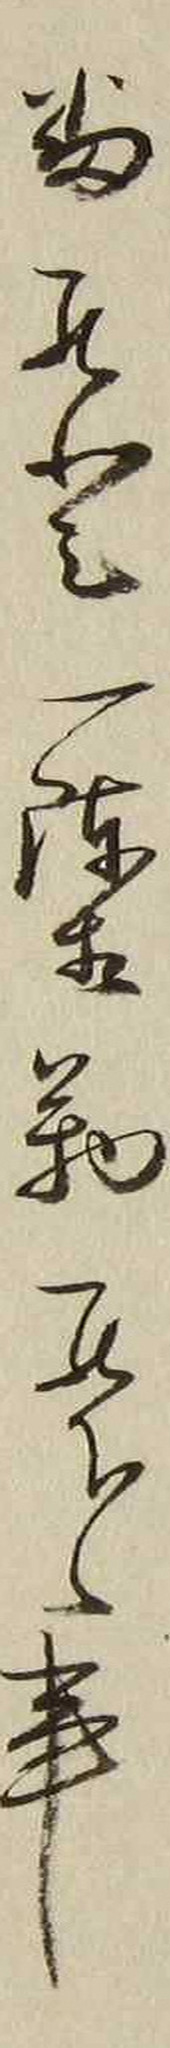番罷登一陣相勤罷下候事
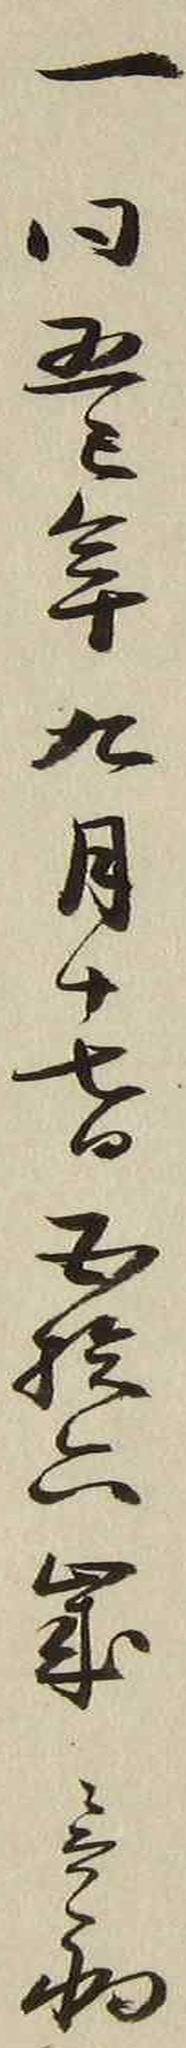一同五巳年九月十七日五拾六歳ニ而病
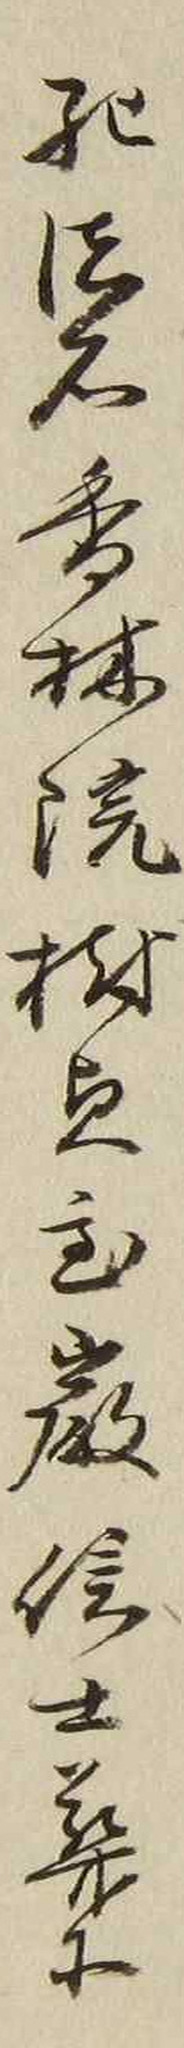死法名香林院樹貞至巌信士葬所
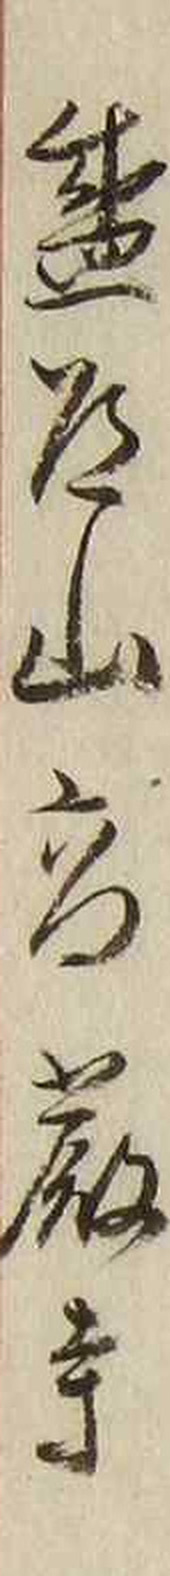盛道山高巌寺

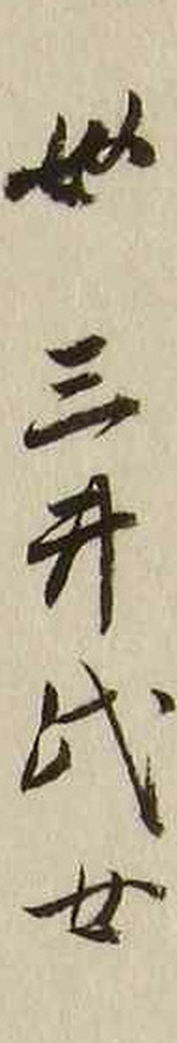母三井氏女
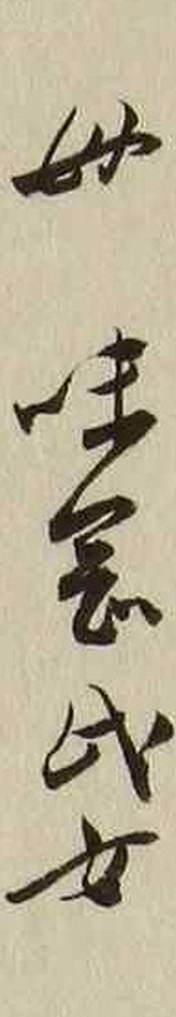母味岡氏女
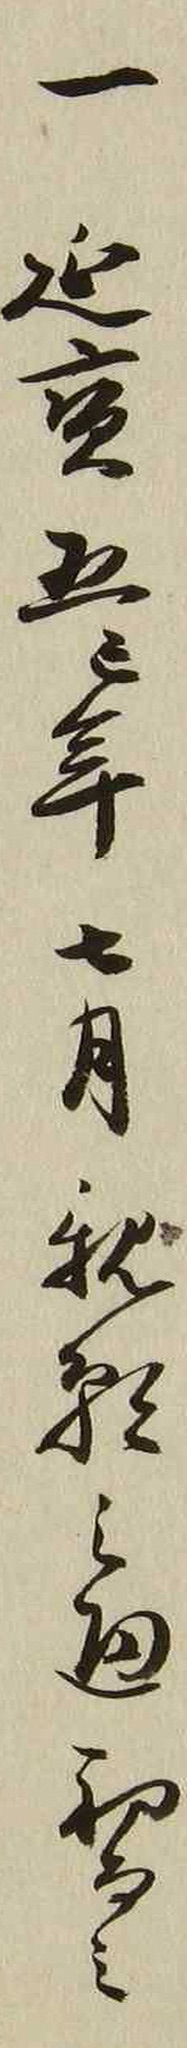一延宝五巳年七月親願之通初而之
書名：諸士系譜　巻之288　さ之部20
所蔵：会津若松市立会津図書館
